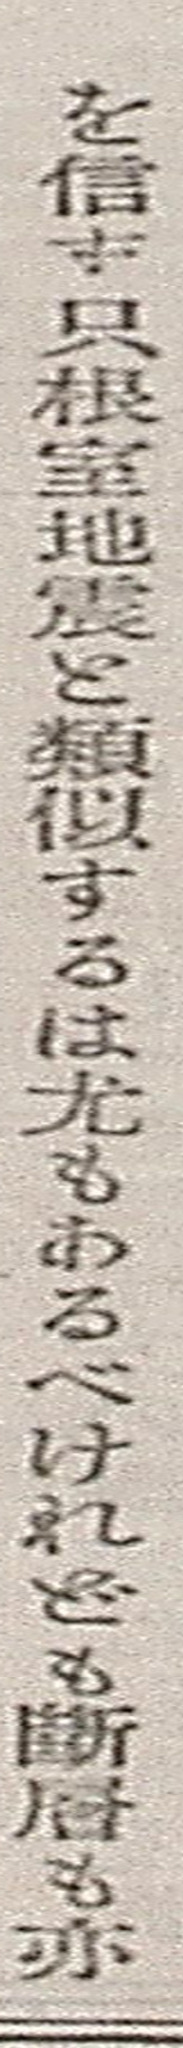を信ず只根室地震と類似するは尤もあるべけれども断層も亦
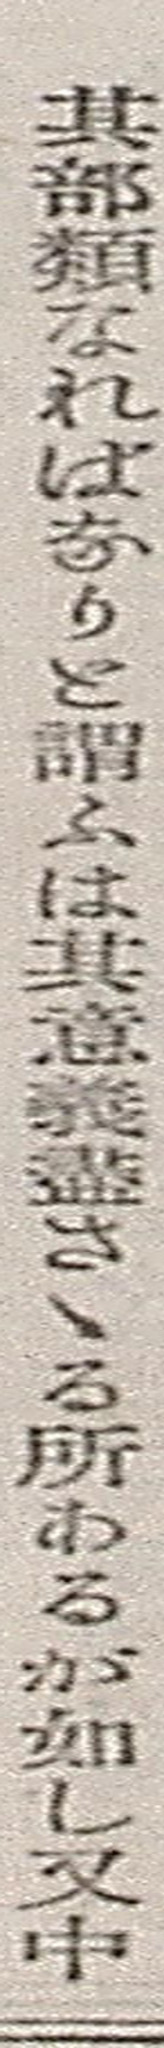其部類なればなりと謂ふは其意義尽さゝる所あるが如し又中
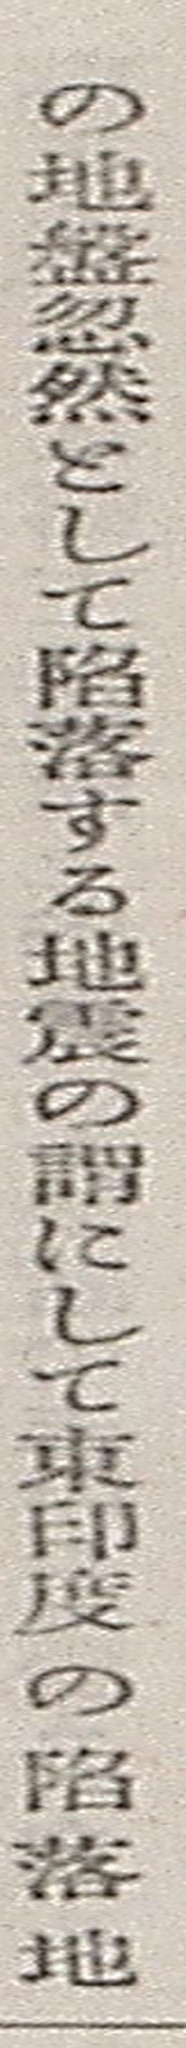の地盤忽然として陥落する地震の謂にして東印度の陥落地
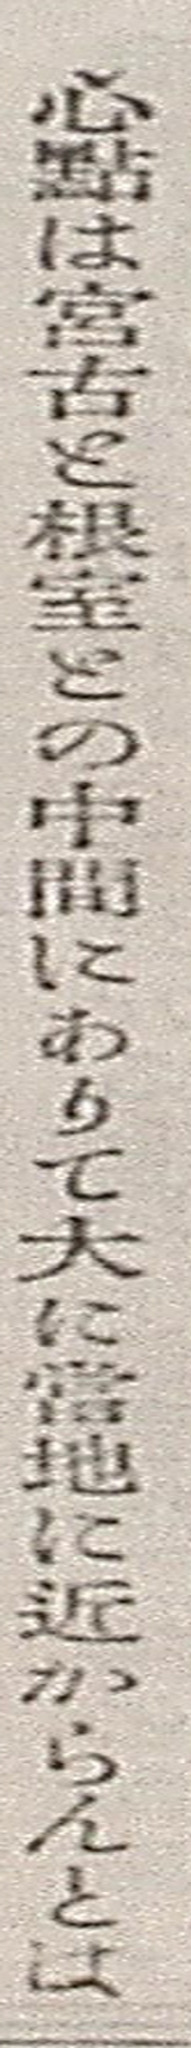心点は宮古と根室との中間にありて大に当地に近からんとは
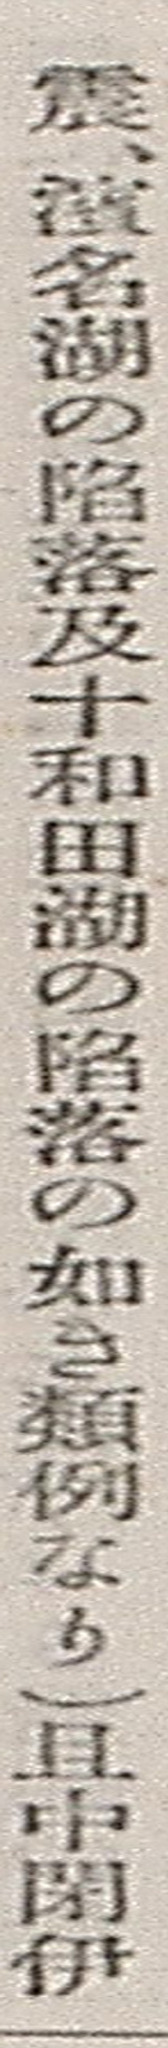震、浜名湖の陥落及十和田湖の陥落の如き類例なり）且中閉伊
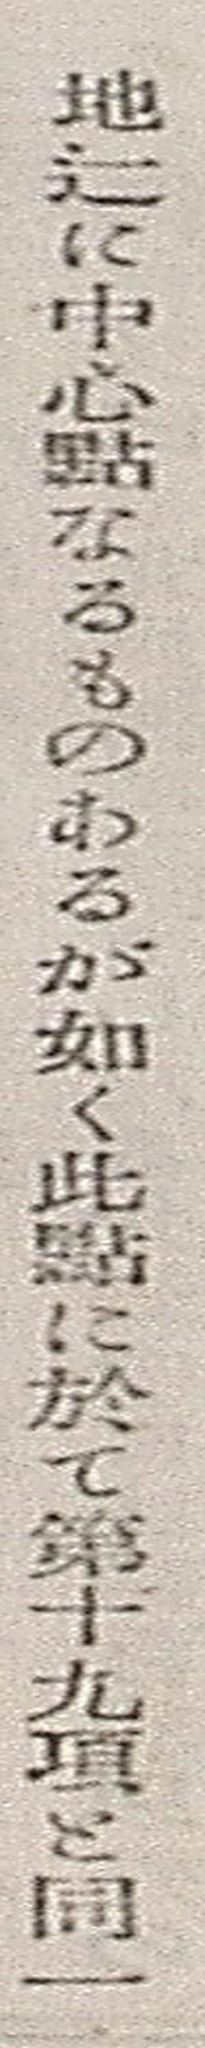地辷に中心点なるものあるが如く此点に於て第十九項と同一
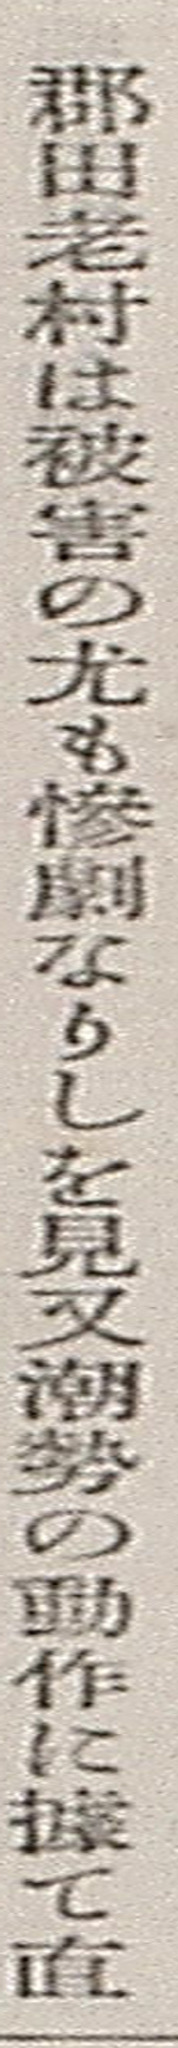郡田老村は被害の尤も惨劇なりしを見又潮勢の動作に拠て直
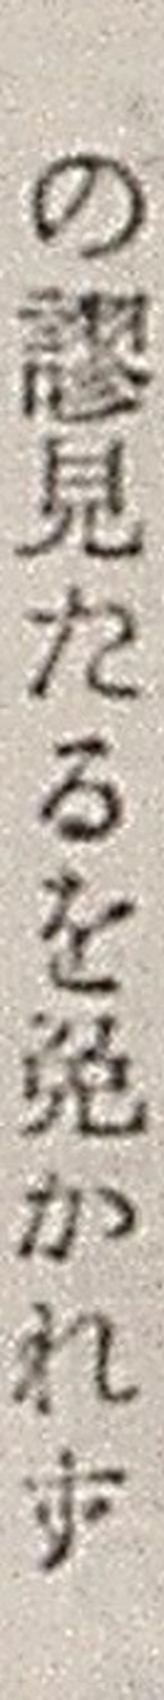の謬見たるを免かれず
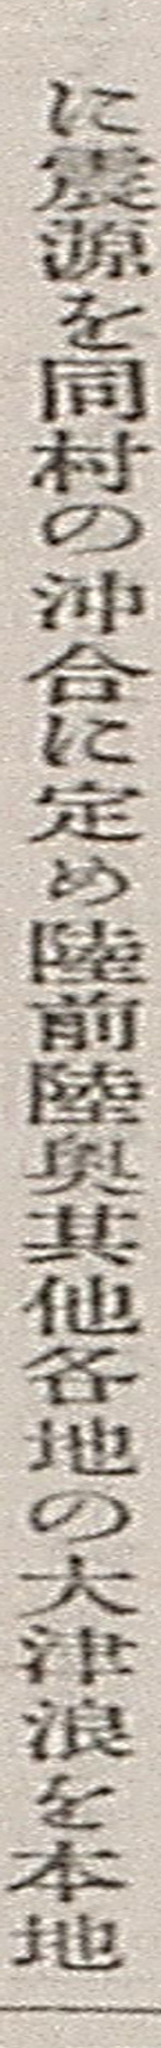に震源を同村の沖合に定め陸前陸奥其他各地の大津浪を本地
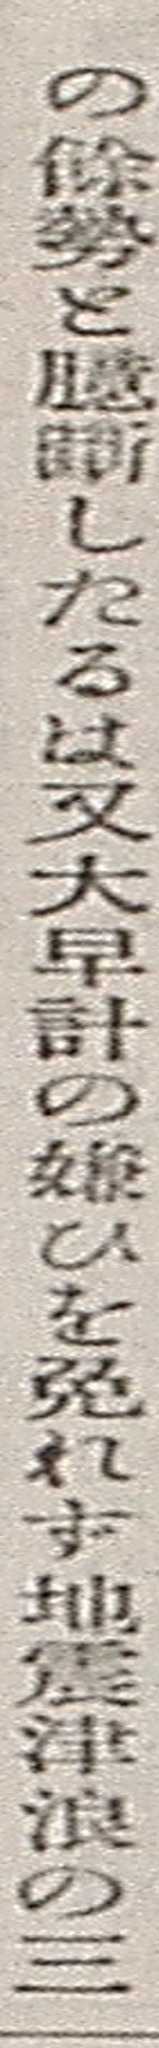の余勢と臆断したるは又大早計の嫌ひを免れず地震津浪の三
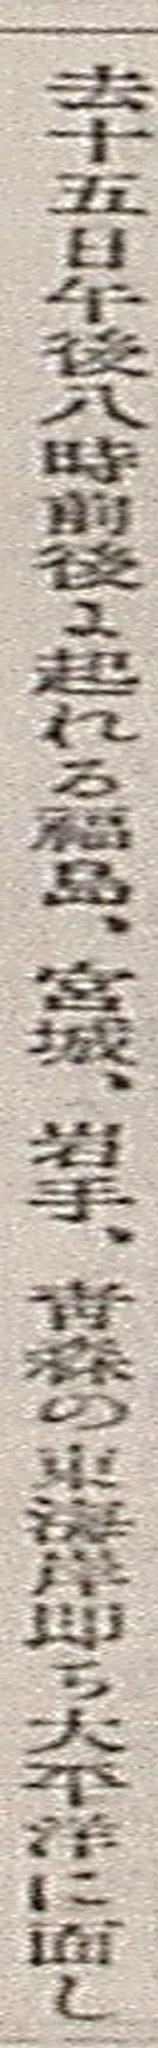去十五日午後八時前後に起れる福島、宮城、岩手、青森の東海岸即ち太平洋に面し
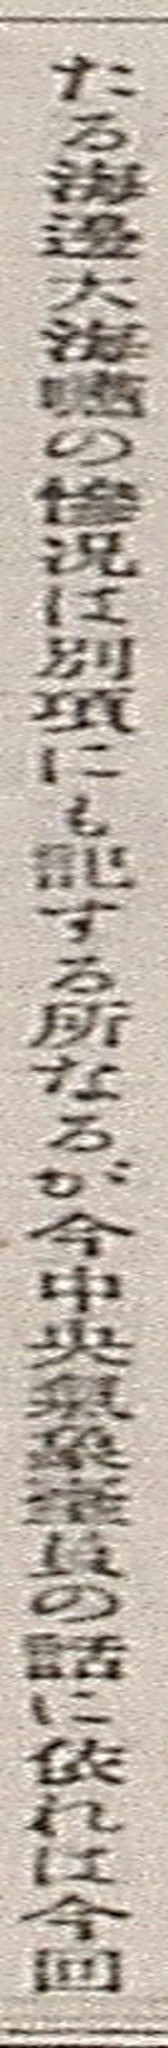たる海辺大海嘯の惨况は別項にも記する所なるが今中央気象台員の話に依れは今回
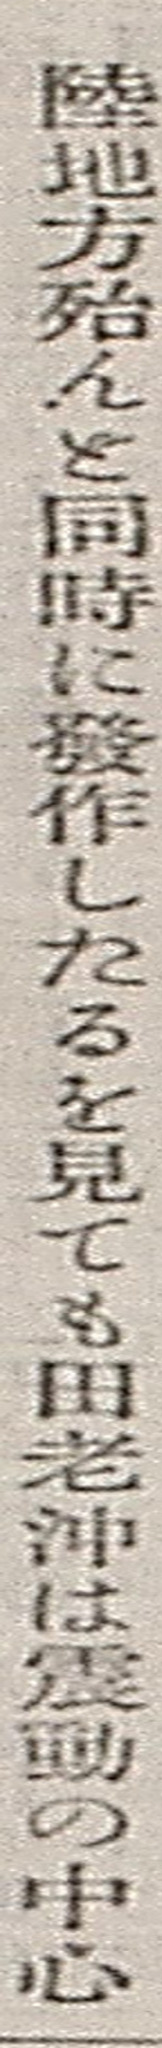陸地方殆んと同時に発作したるを見ても田老沖は震動の中心
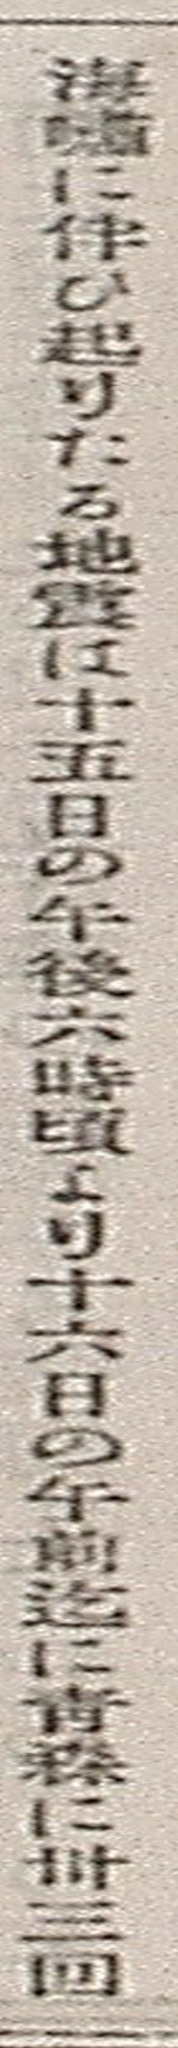海嘯に伴ひ起りたる地震は十五日の午後六時頃より十六日の午前迄に青森に卅三回
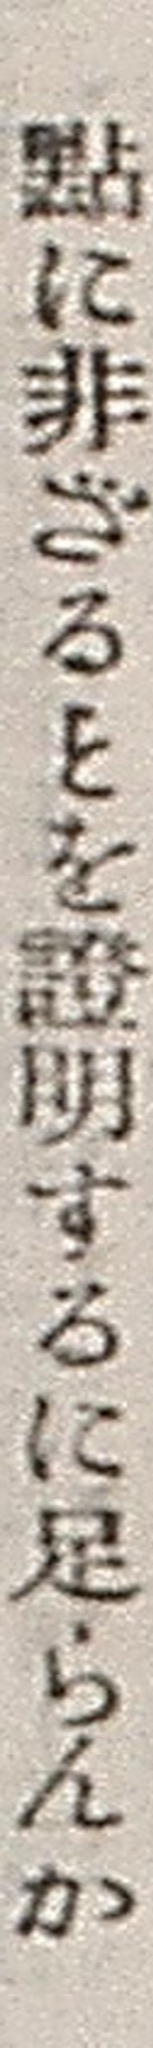点に非ざることを証明するに足らんか
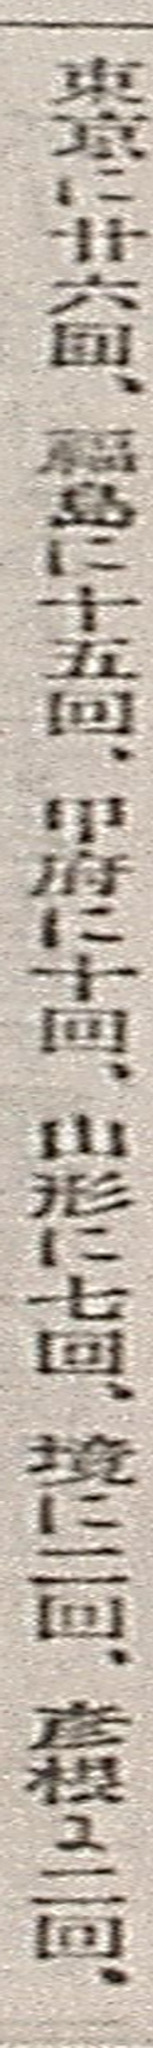東京に廿六回、福島に十五回、甲府に十回、山形に七回、境に二回、彦根に二回、
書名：風俗畫報臨時増刊第百十九號　大海嘯被害録（中）
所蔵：東京大学地震研究所図書室 Earthquake Research Institute Library, The University of Tokyo, JAPAN
